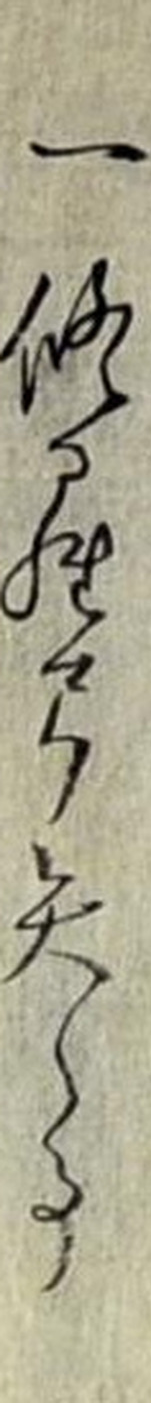一修弓矢之事
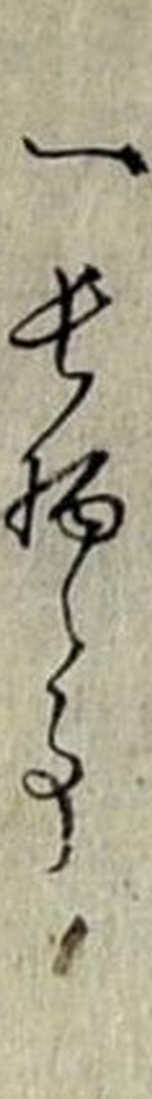一長柄之事
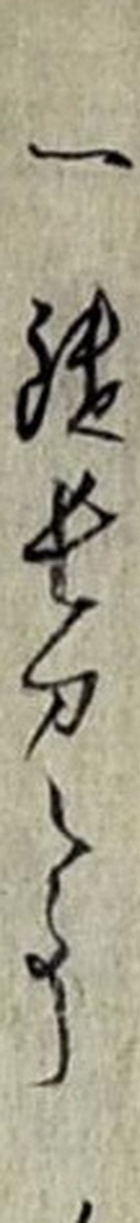一長柄之事
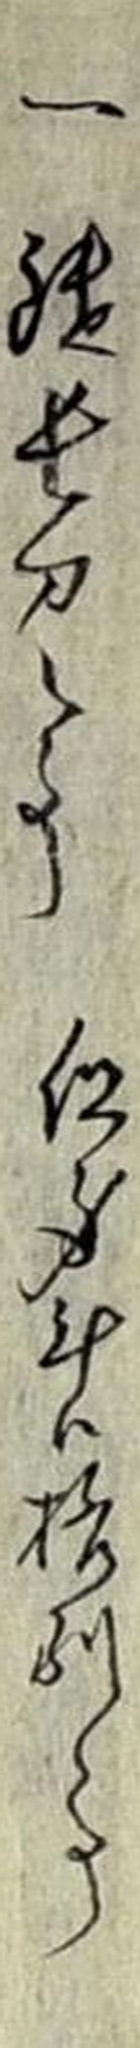一鑓長刀之事但身斗ハ格別之事
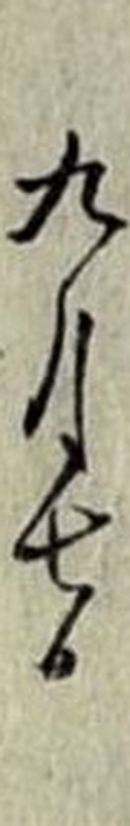九月七日
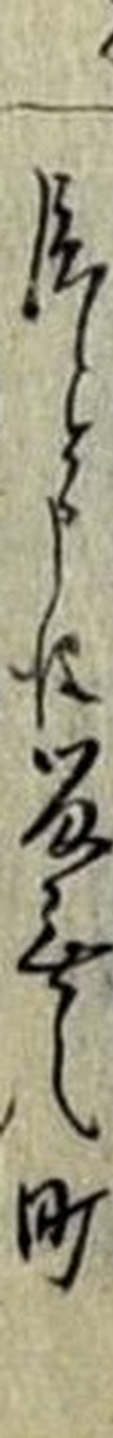渡候と申儀留無之町
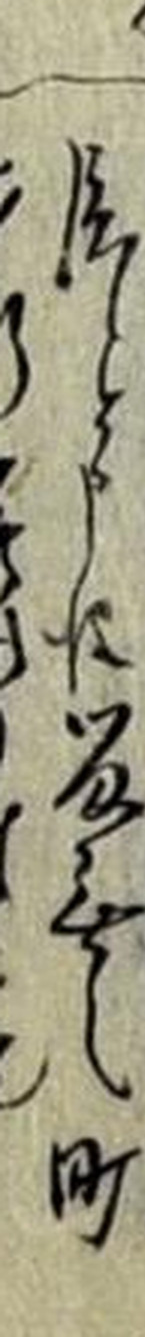渡候と申儀留無之町
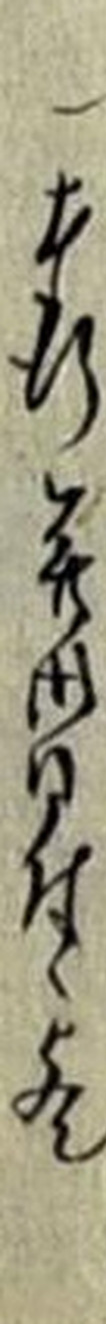奉行并御目付へ歟
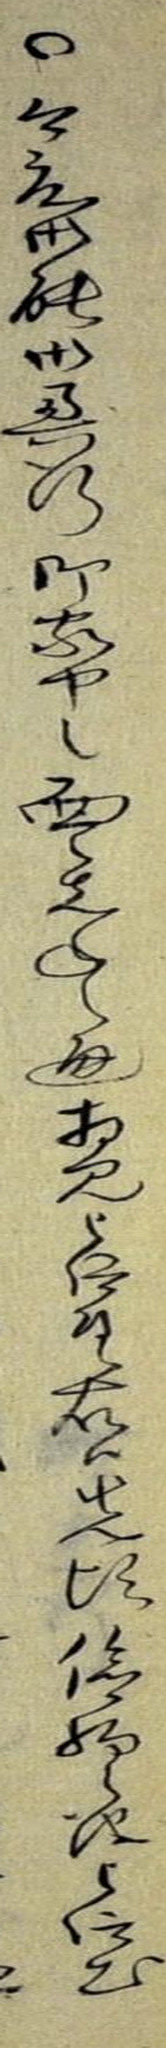〇今度御能御興行御家中之面々先年之通拝見被仰付候右ハ先頃倹約之儀被仰出
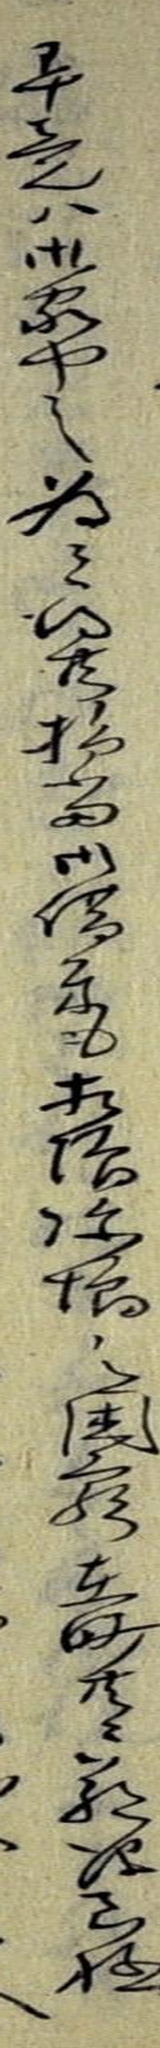畢竟ハ御家中之為ニ候得共指当御借米も相増弥増之困窮在町共ニ難儀至極
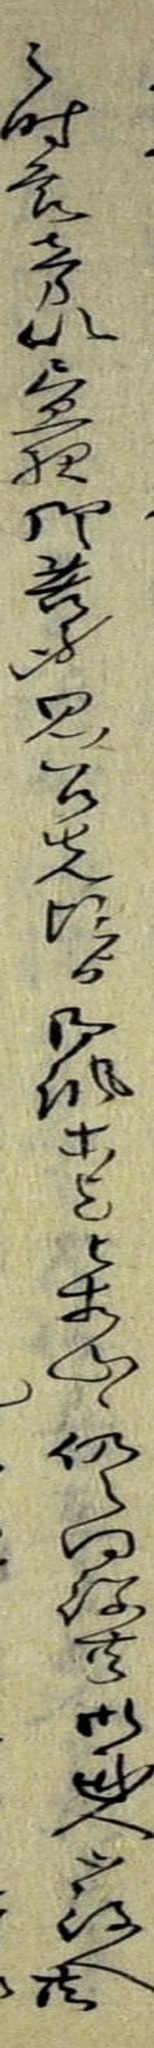之時節旁以昼夜御苦身思召先頃ゟ御等迄被相止候仍之同役共御用人御役人共
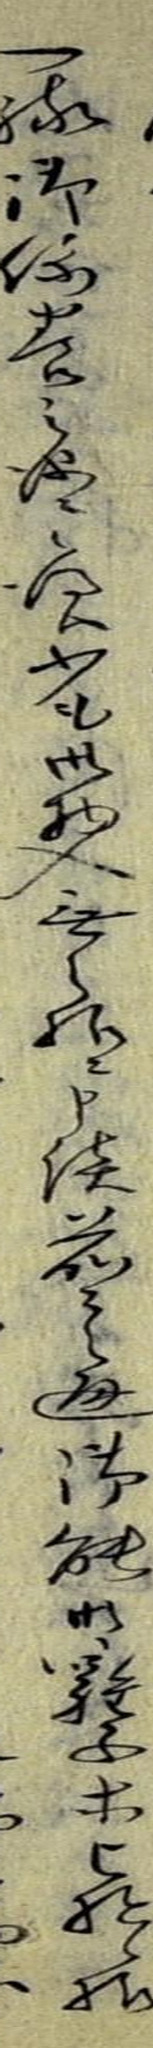一統御保養之儀ニ候得ハ少も御物入無之様ニ申談前々之通御能御囃子等被遊候様
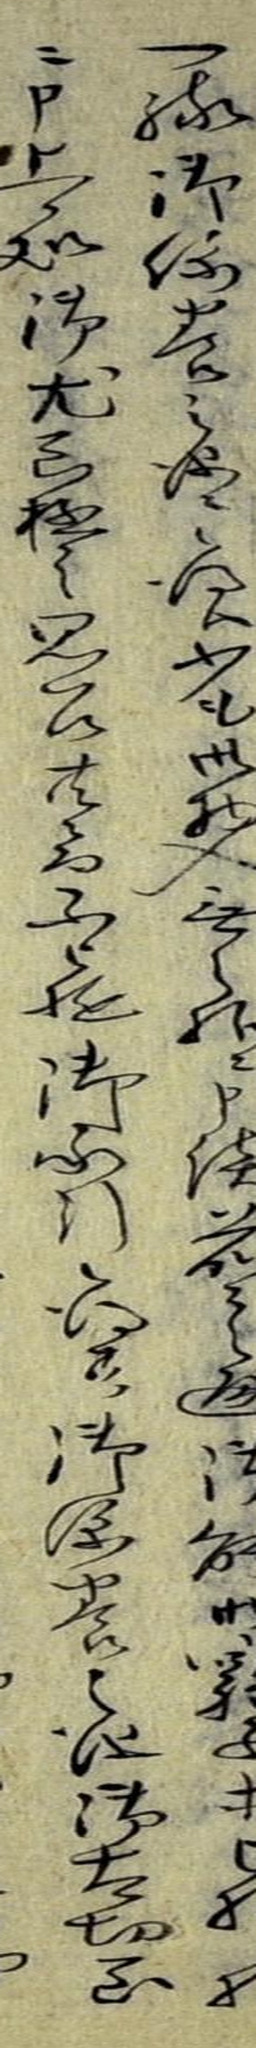ニ申上候処御尤至極之思召共ニ而不被遊御承引候得共御保養之儀御太切至
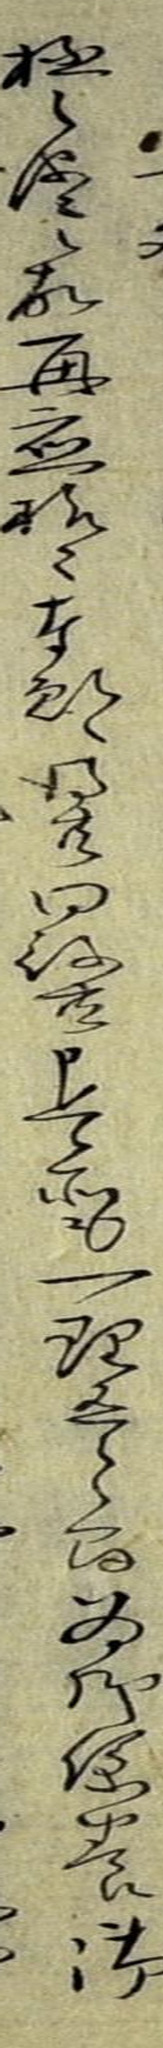極之儀ニ候故再応様々奉願候得共同役共申上候所も一理有之候間為御保養御
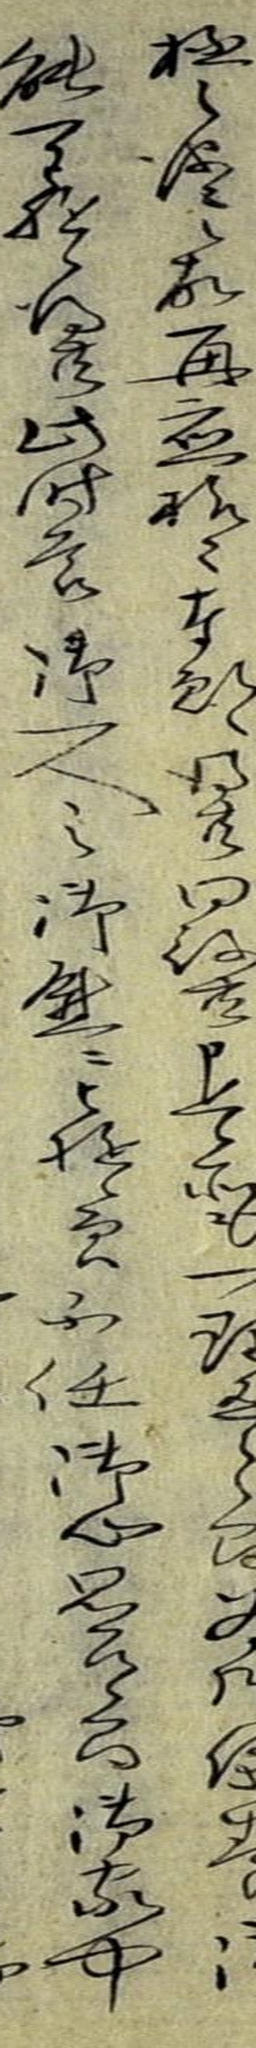能可被遊候得共此時節御一人之御慰ニ被遊候而ハ不任御心思召候間御家中
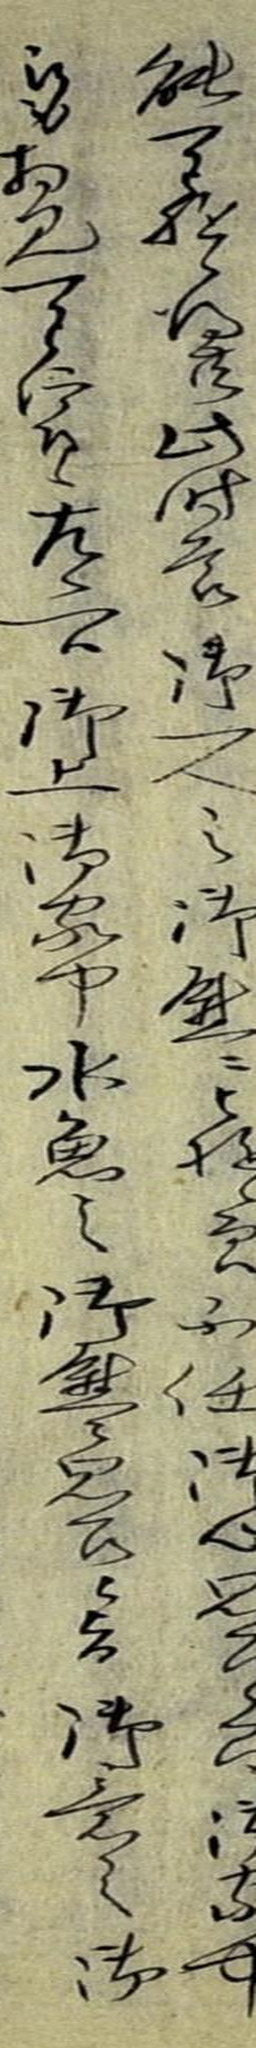江も拝見可被仰付候左候ヘハ御上御家中水魚之御慰ニ思召候旨御意之御
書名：命令之部 一
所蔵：福井県文書館 Fukui Prefectural Archives
